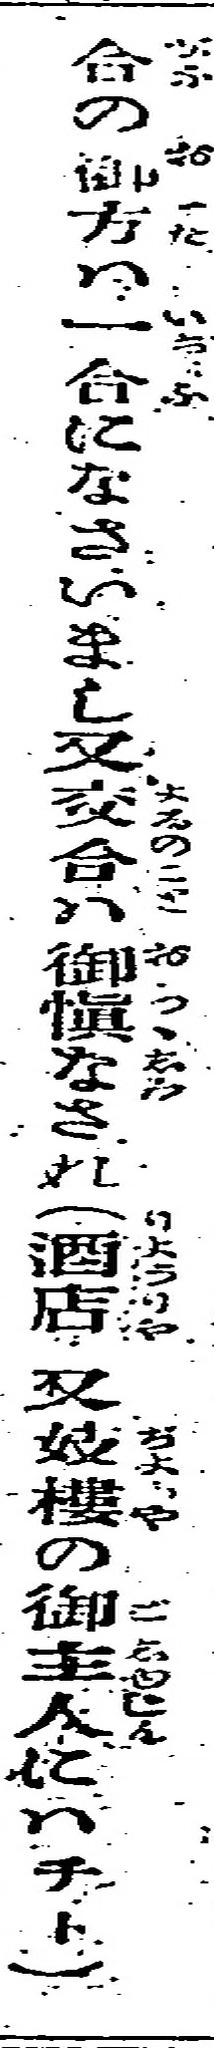合の御方は一合になさいまし又交合は御慎なされ[酒店又妓楼の御主人にはちと]
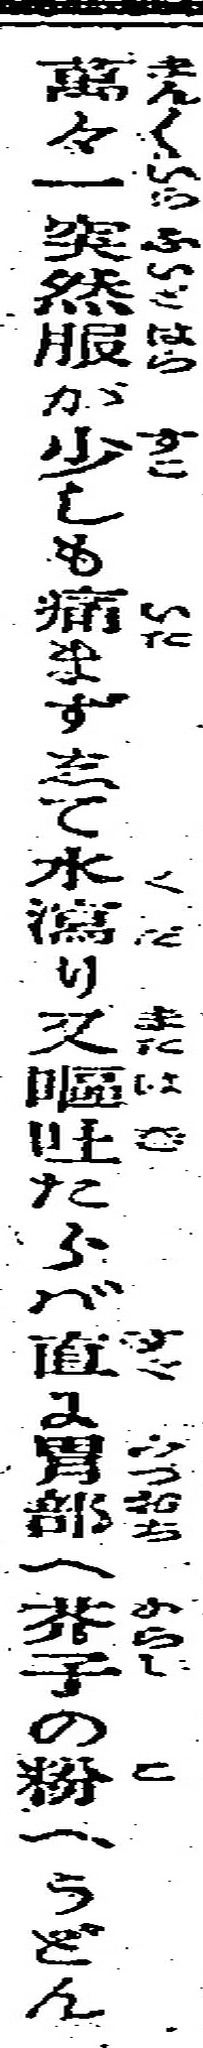萬々一突然服が少しも痛まずして水瀉り又嘔吐たらば直に胃部へ芥子の粉へうどん
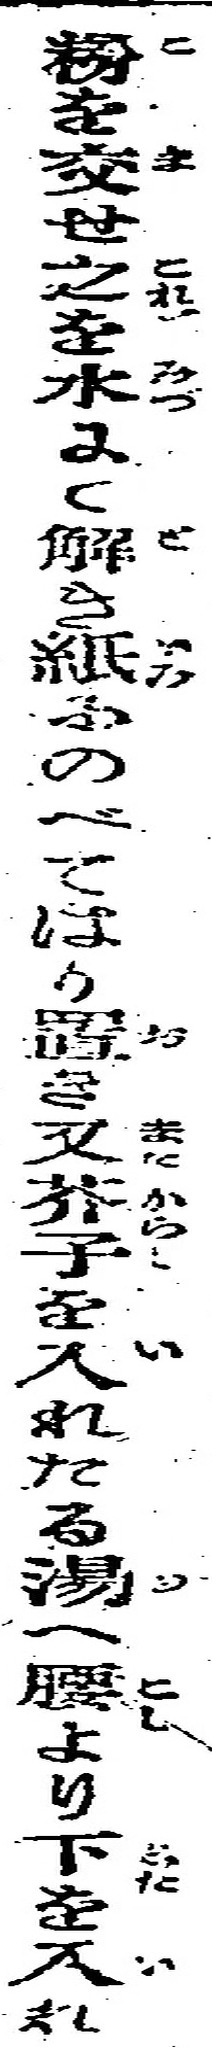粉を交せ之を水にて解き紙にのべてはり置き又芥子を入れたる湯へ腰より下を入れ
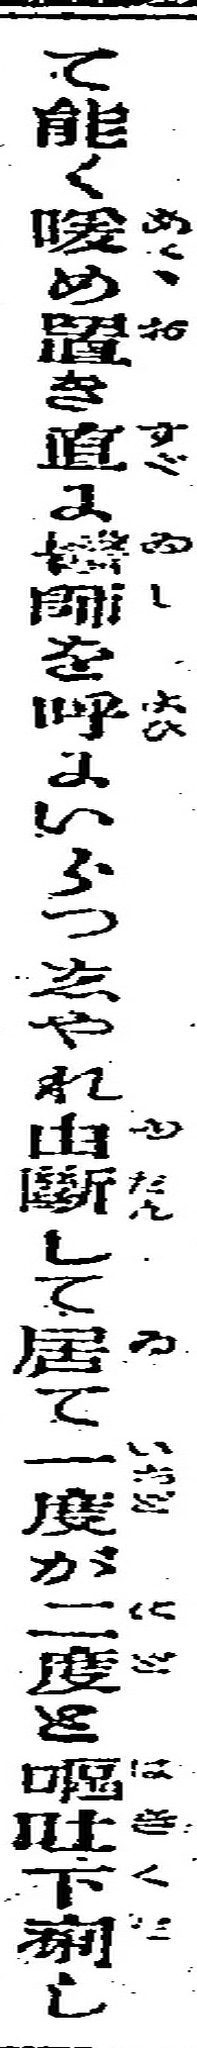て能く暖め置き直に醫師を呼にいらつしやれ油断して居て一度が二度と嘔吐下痢し
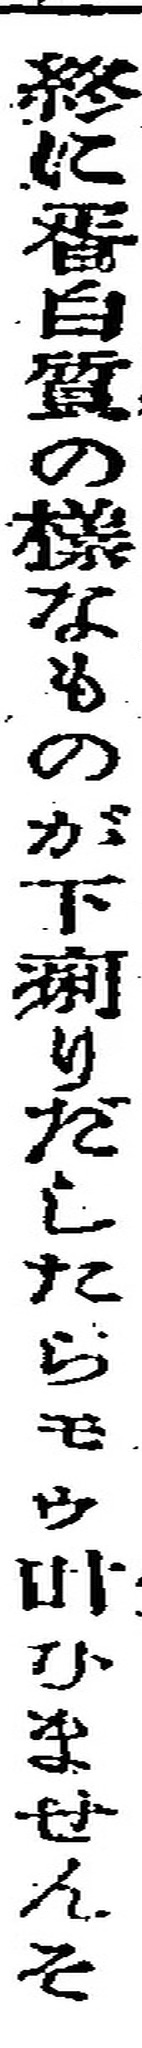終に蛋白質の様なものが下痢りだしたらもう叶ひませんそ
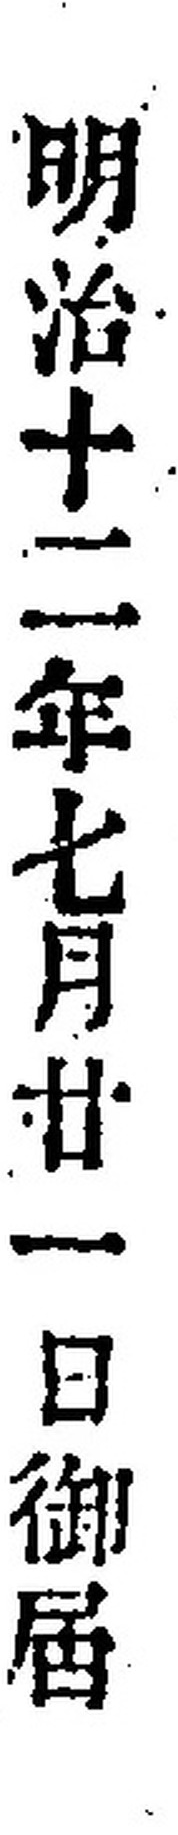明治十二年七月廿一日御届
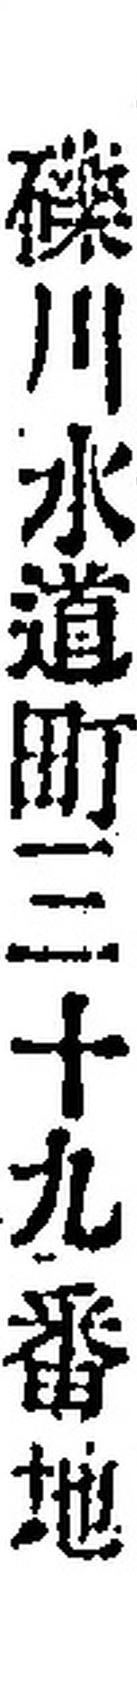礫川水道町三十９番地
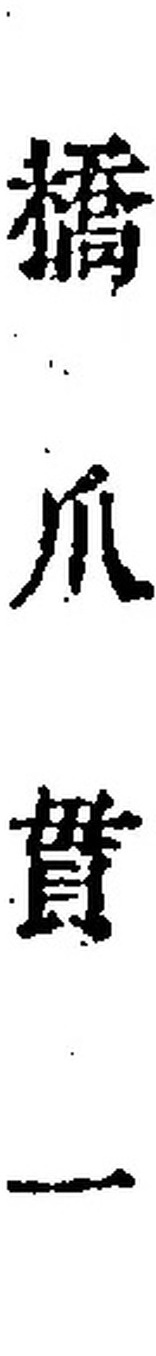橋爪貫一
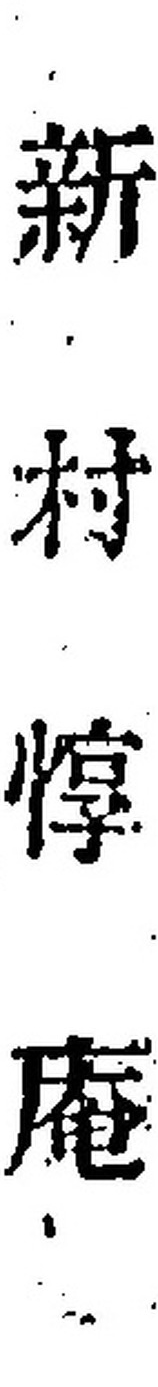新村惇庵
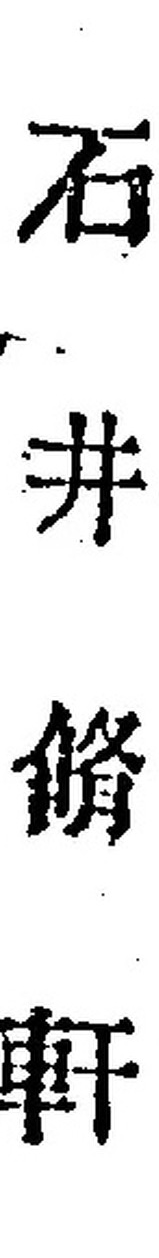石井脩軒
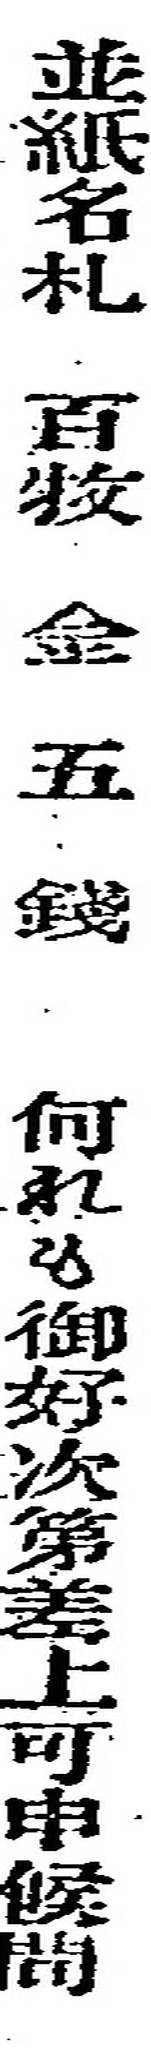並紙名札百枚金五銭何れも御好次第差上可申候問
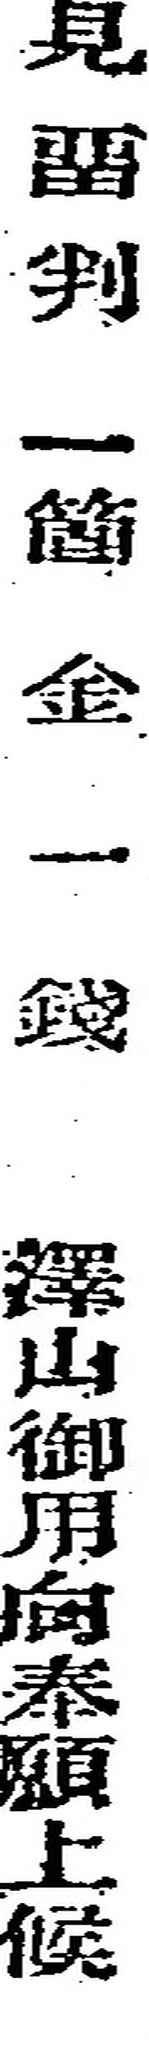見畱判一箇金一銭澤山御用向奉願上候
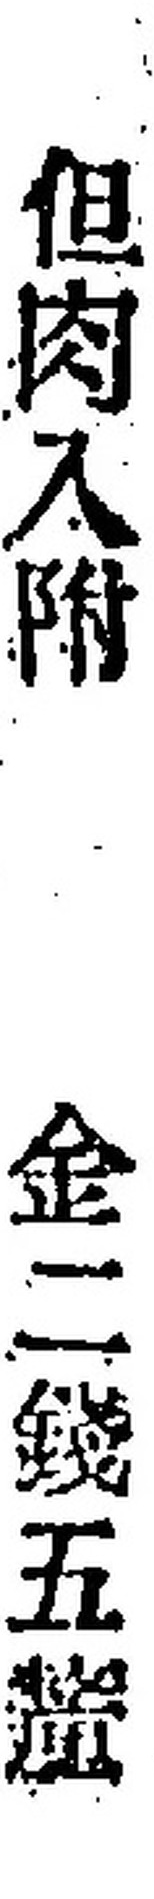但肉入附金二銭五厘
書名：虎列剌病予防の心得
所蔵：国立国会図書館 National Diet Library, JAPAN
